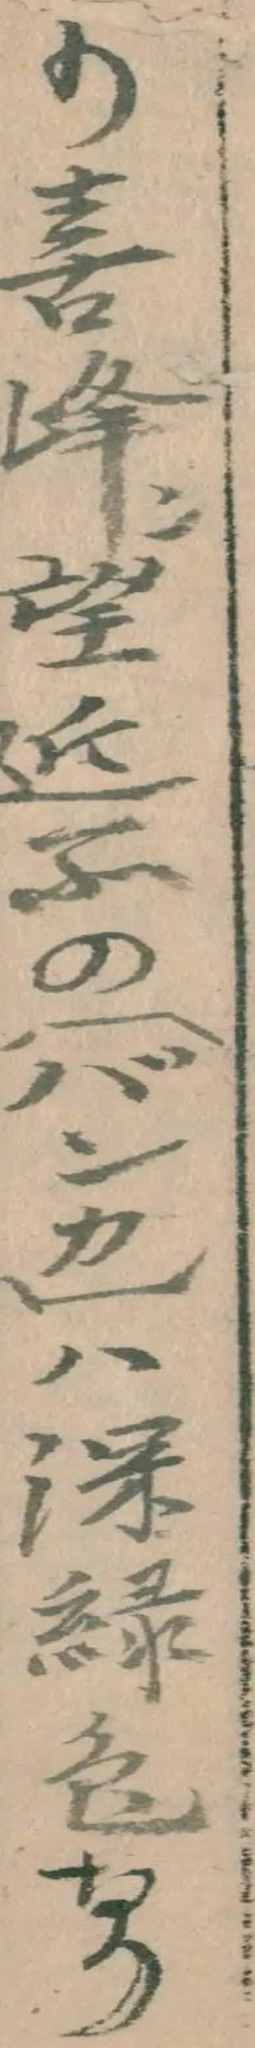り喜峰望近所の(バンカ)は深緑色なり

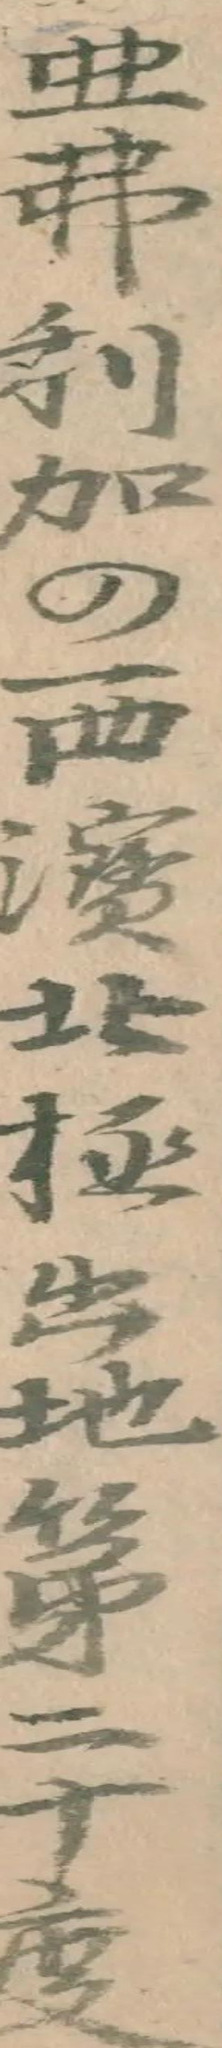亜弗利加の西浜北極出地第二十度
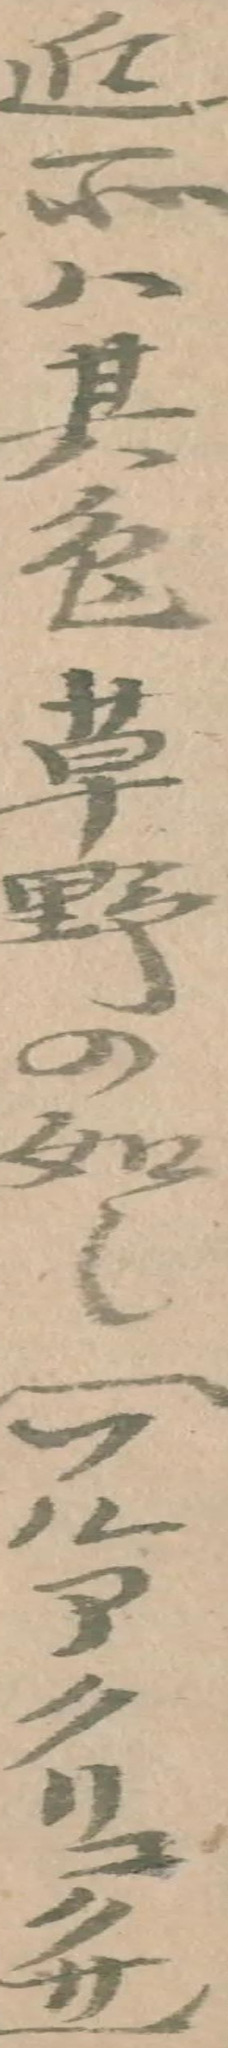近所ハ其色草野の如し(フルアクリュクサ)
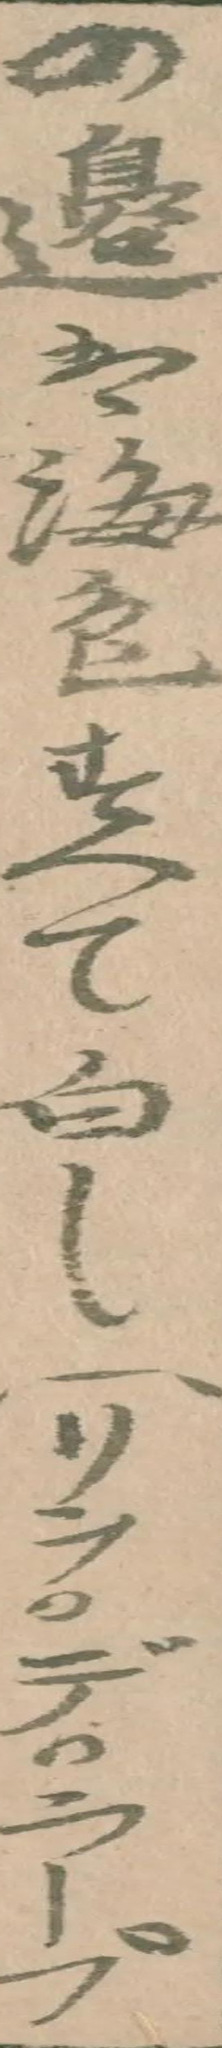の辺々海色すへて白し(リヲ・デ・ラープ
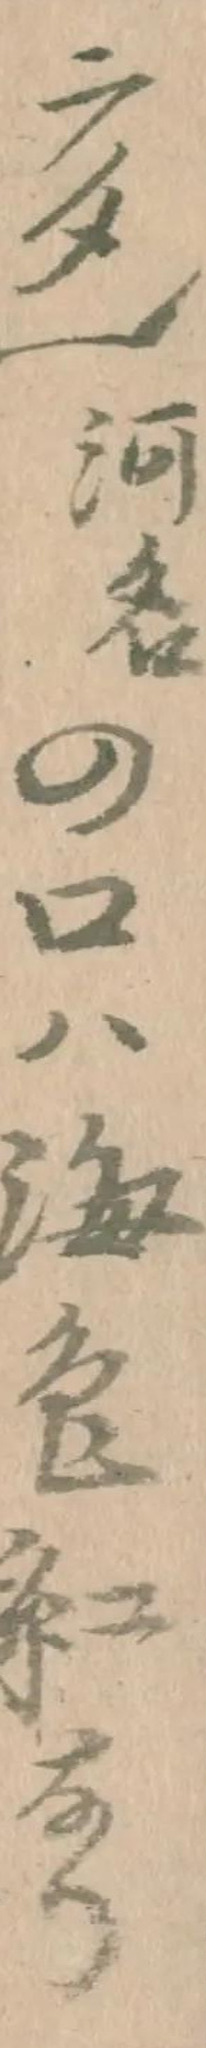ラタ)河名の口ハ海色紅なり
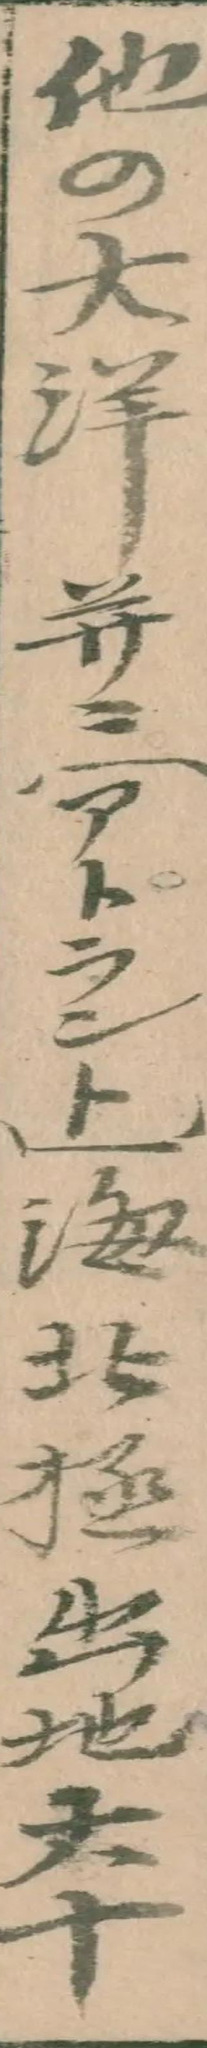他の大洋并ニ(アトラント)海北極出地第六十
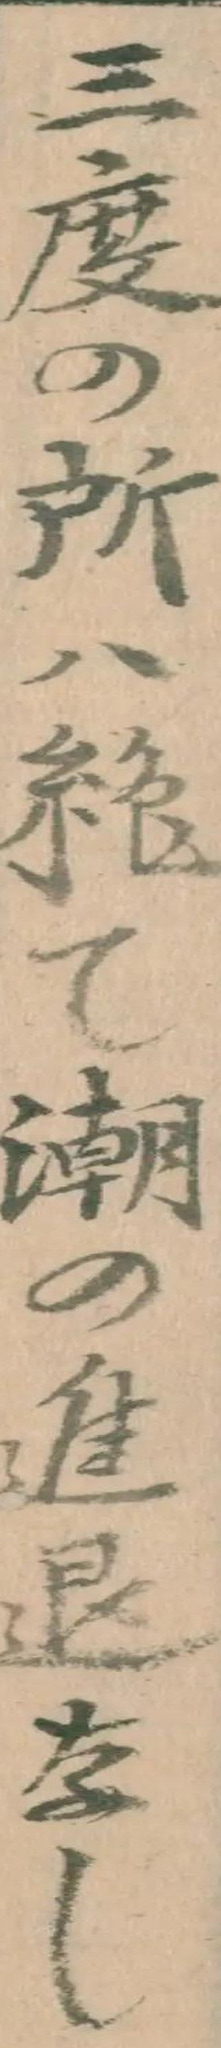三度の所ハ絶て潮の進退なし
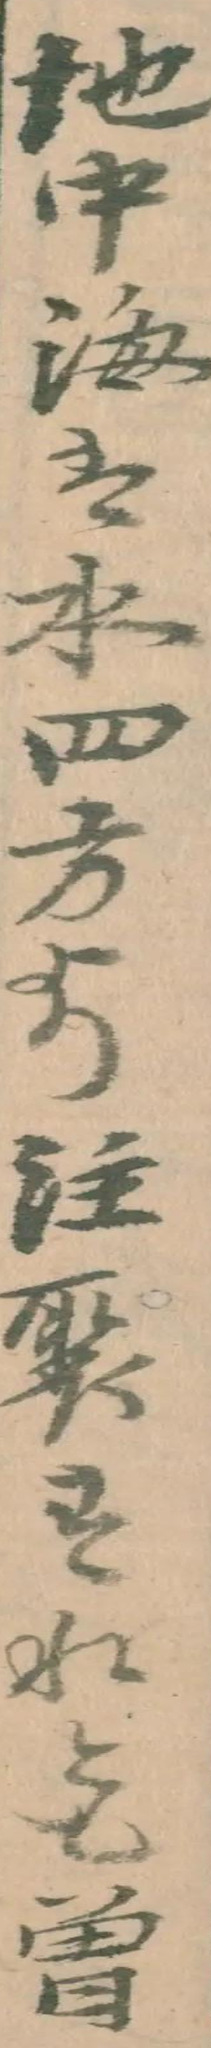地中海は水四方より注聚すれとも曽
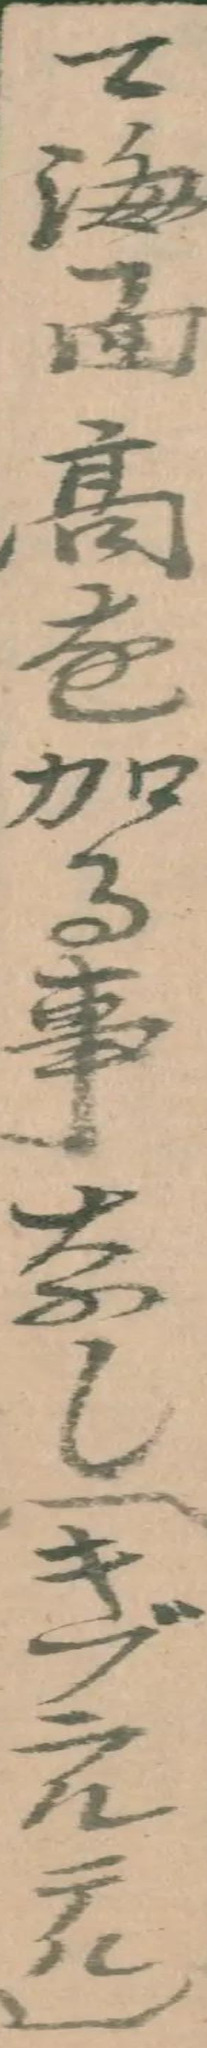て海面高を加る事なし(キブラルテル)
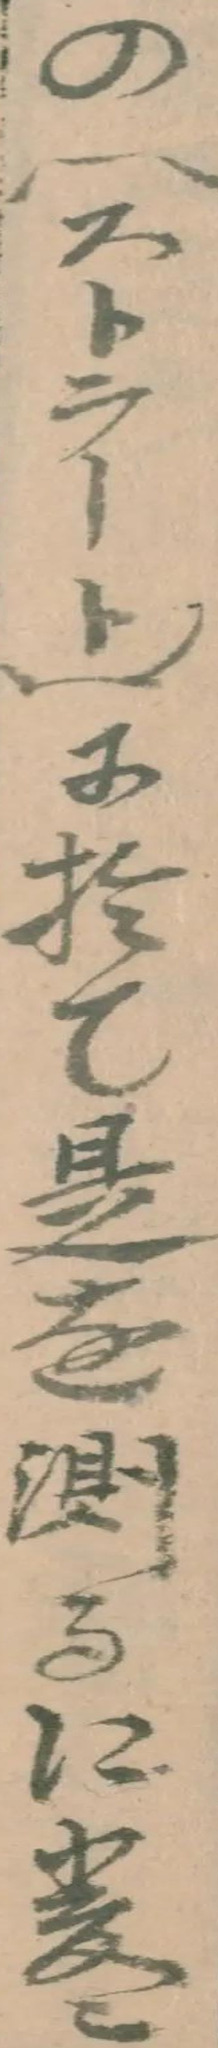の(ストラート)に於て是を測るに爰ニ
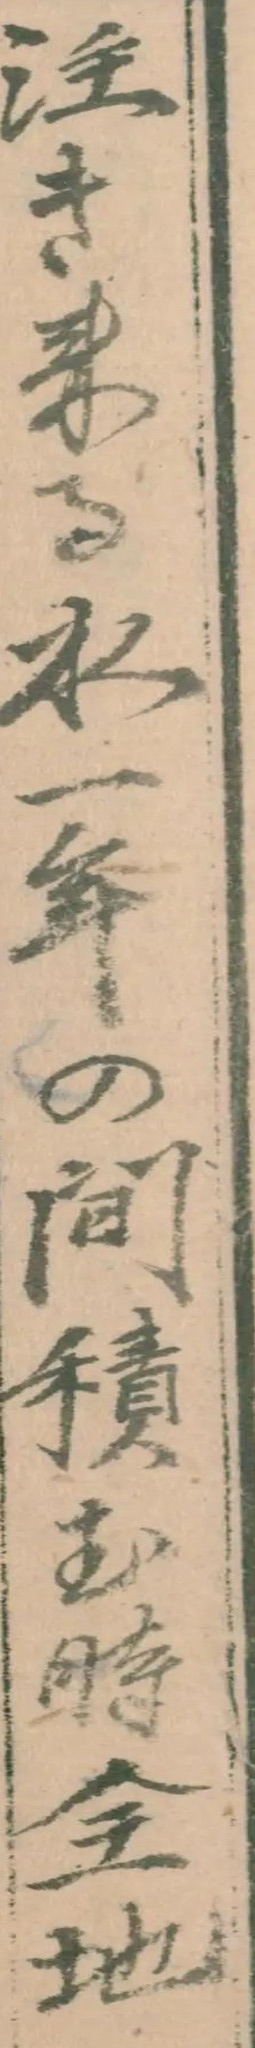注き来る水一年の間積む時全地
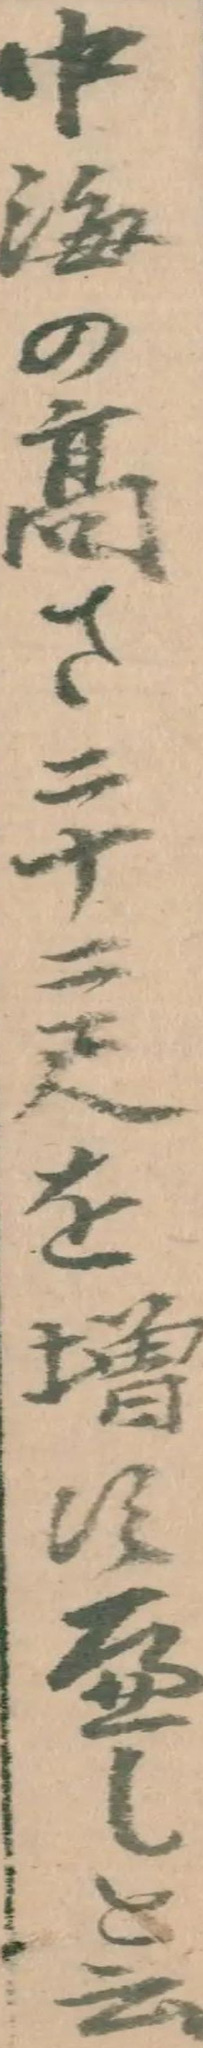中海の高さ二十二尺を増すへしと云
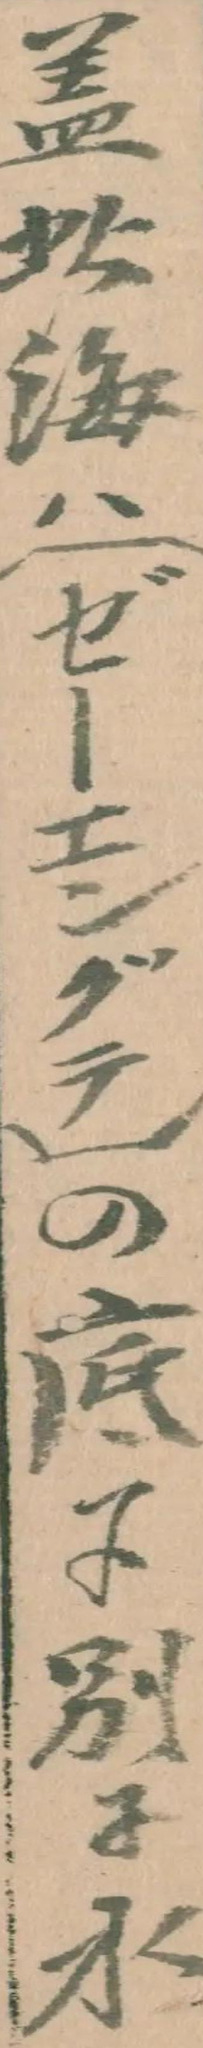蓋此海ハ(ゼーエングテ)の底に別に水
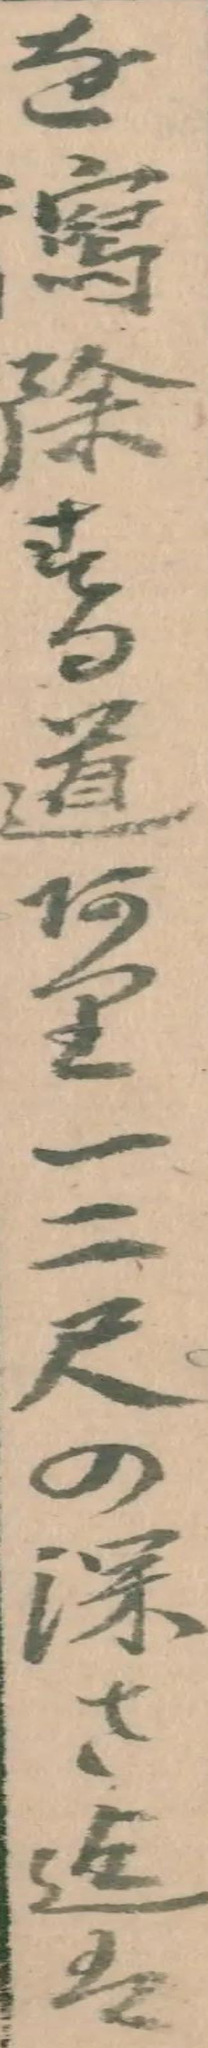を瀉除する道あり一二尺の深さ迄は
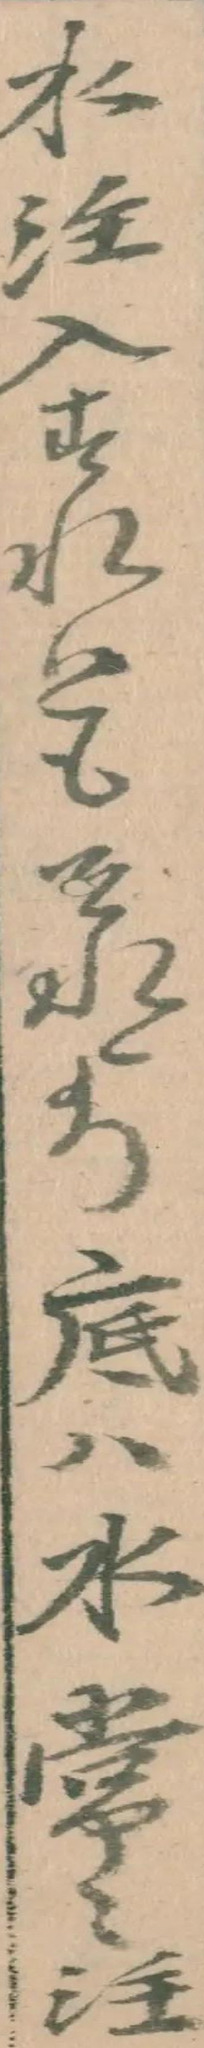水注入すれともそれより底ハ水常々注
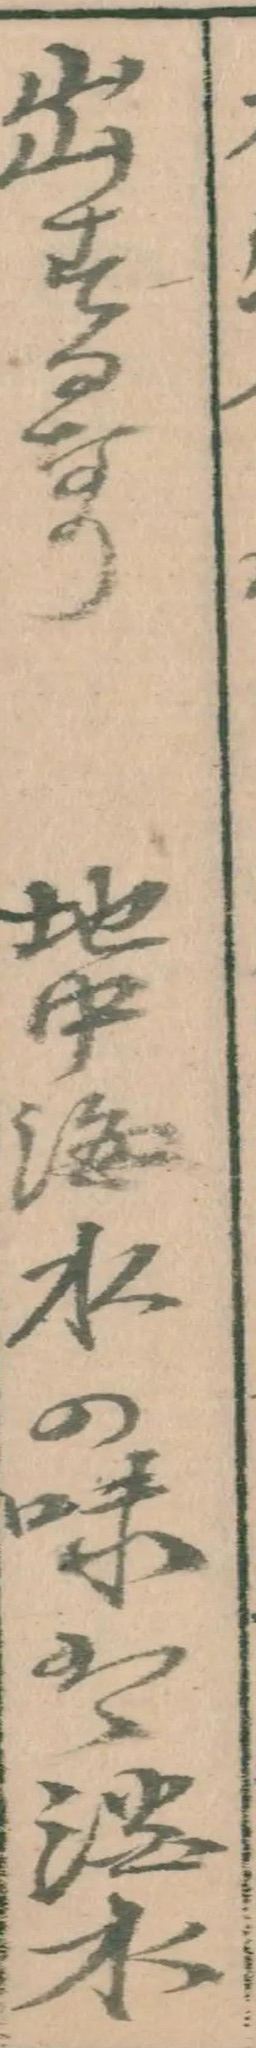出するなり地中海水の味は淡水
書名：新釈輿地図説
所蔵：国立国会図書館 National Diet Library, JAPAN
